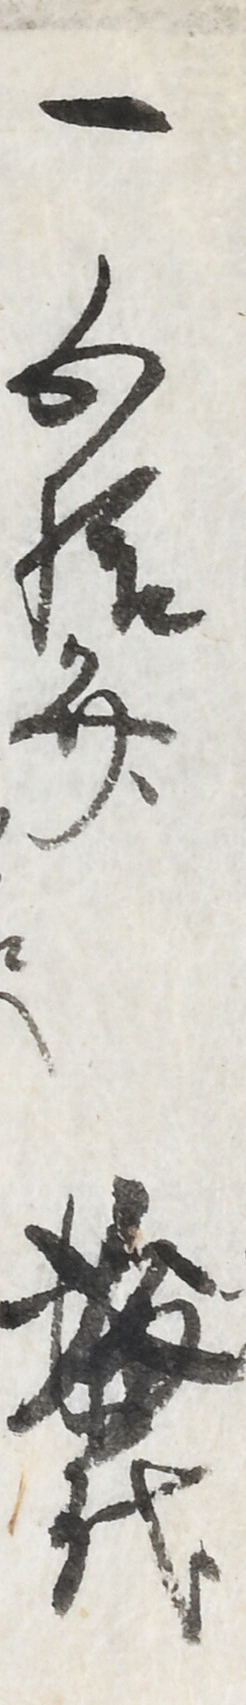一五拾文茶代
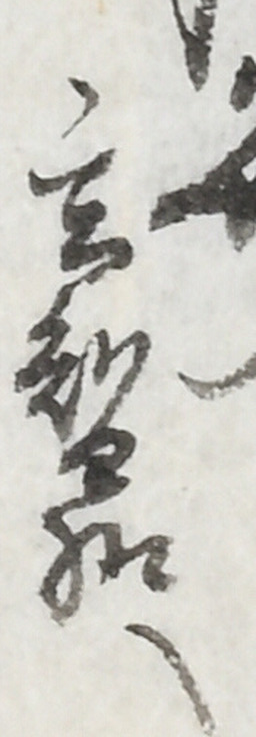玄智様へ
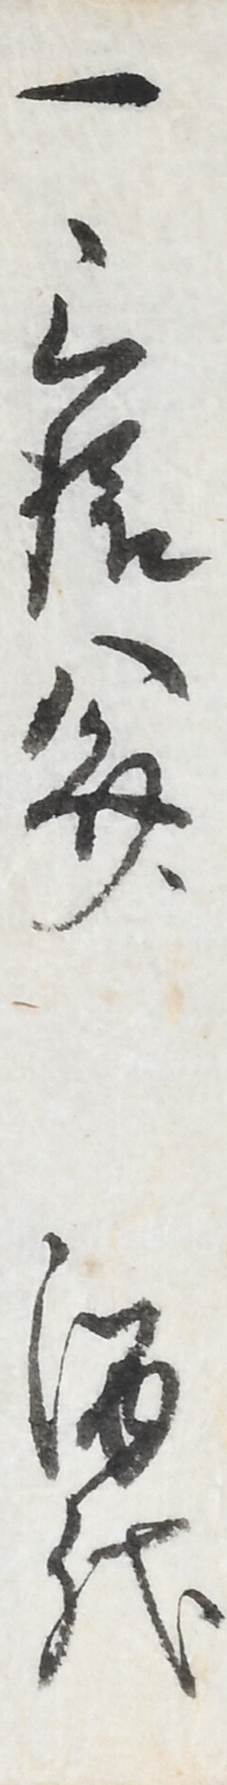一三拾八文酒代
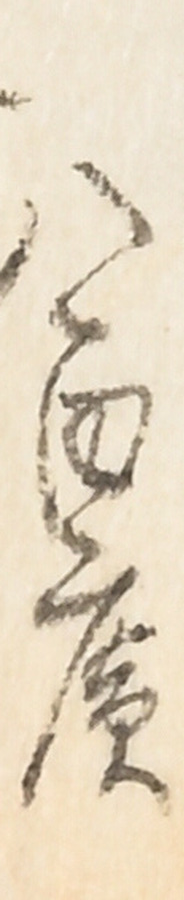八百廣
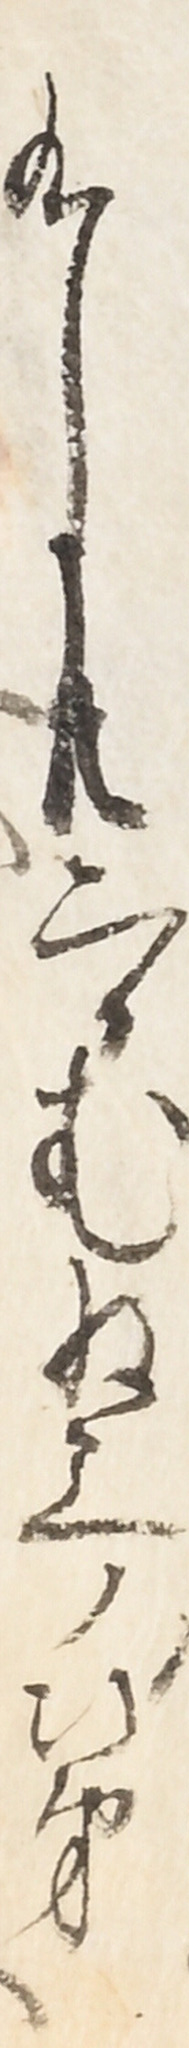九月廿二日むね上ノ次第

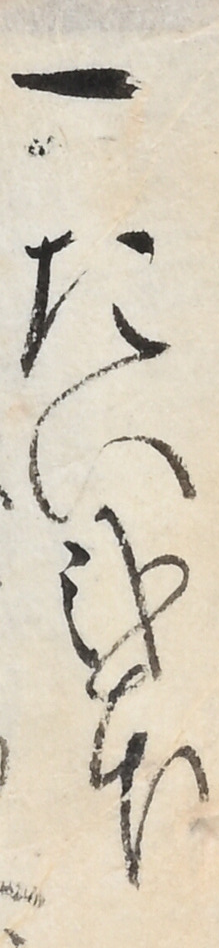一たい弐本
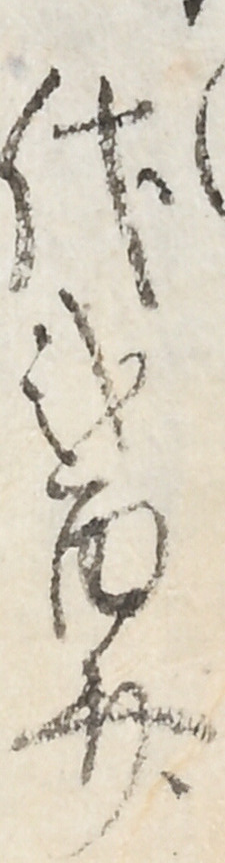代弐百文
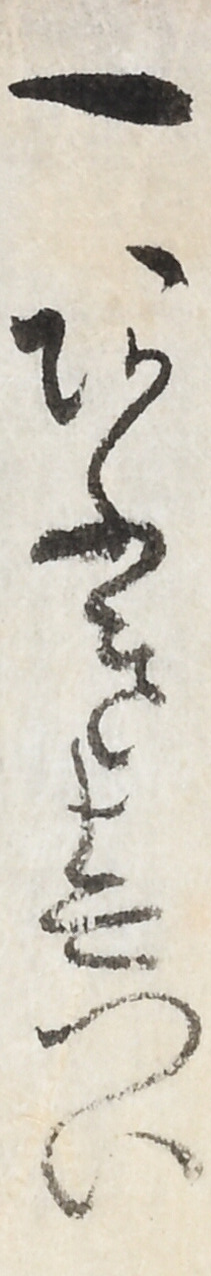一あふき壱つい
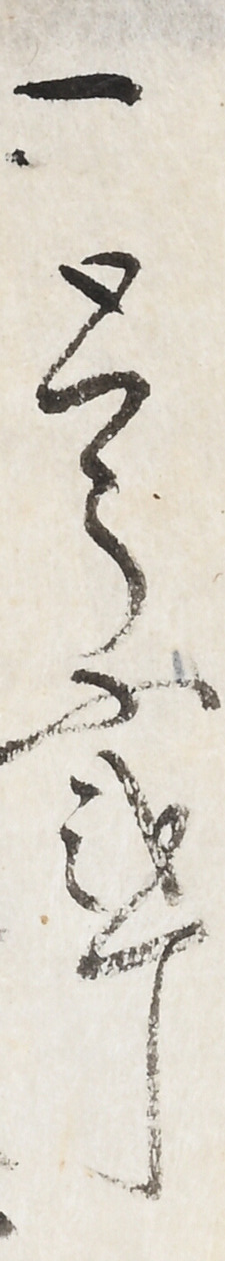一とうふ弐丁
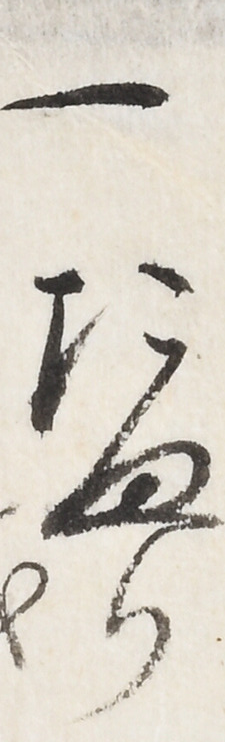一たまり
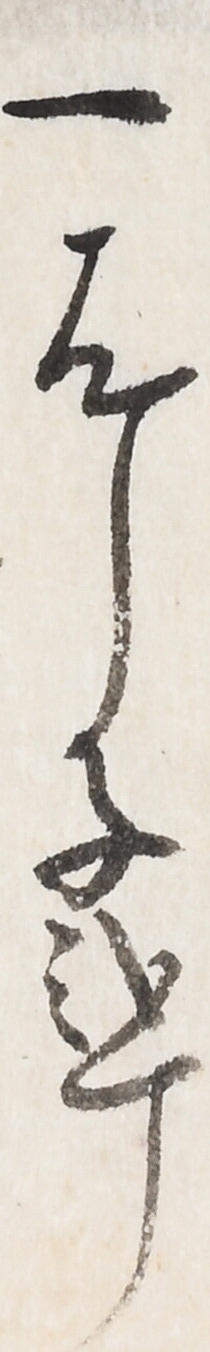一はし子弐丁
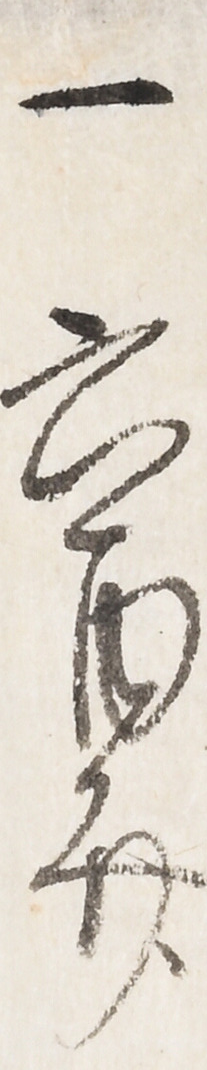一六百文
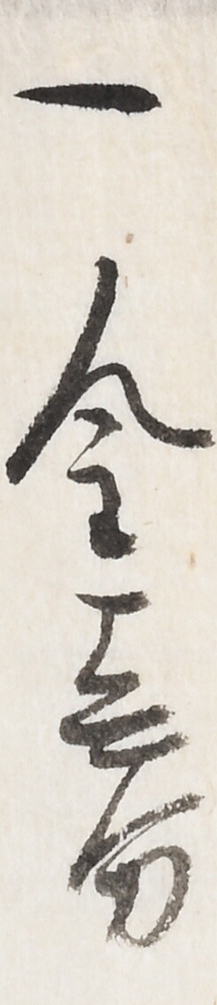一金壱分
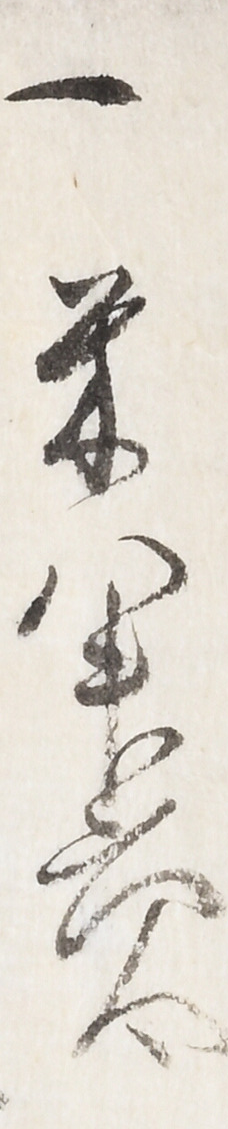一米八升六合
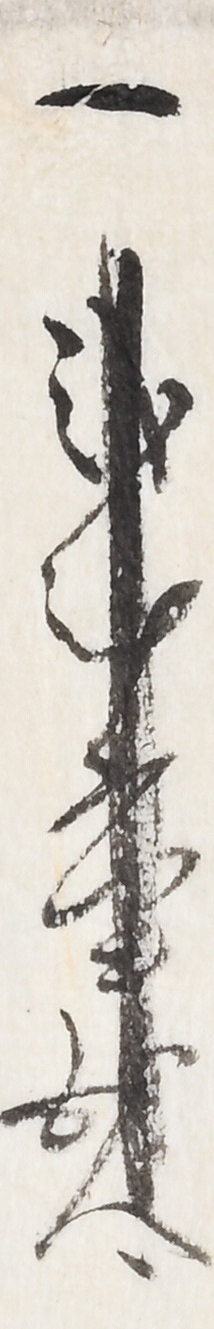一茶弐升五合
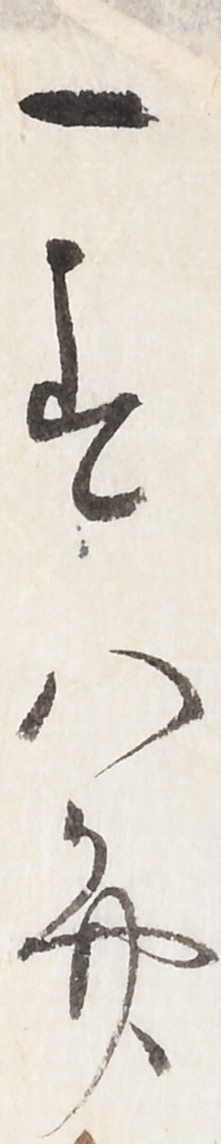一す八文
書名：合力覚帳
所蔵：伊那市立高遠町図書館・合同会社AMANE
